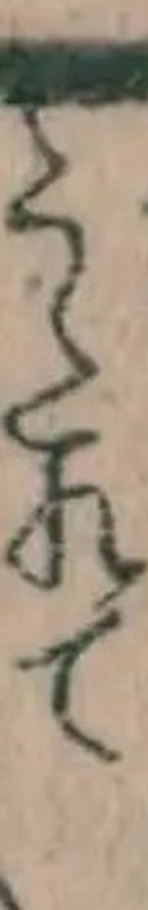うたれて
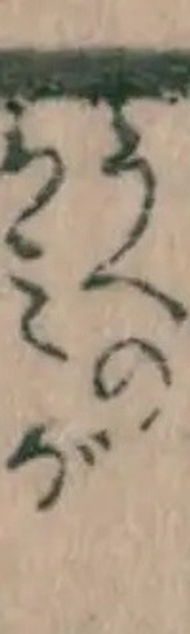かみが
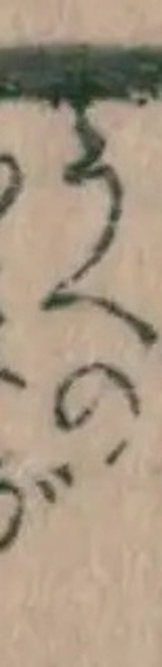うへの
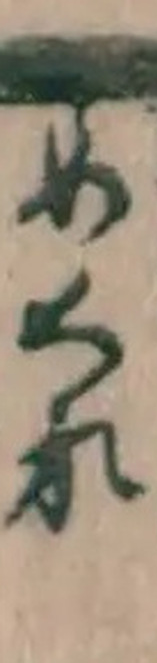めくれ
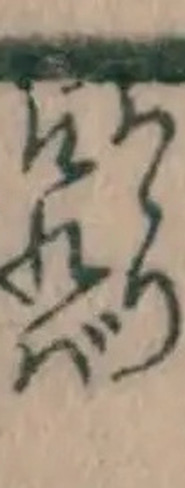ければ
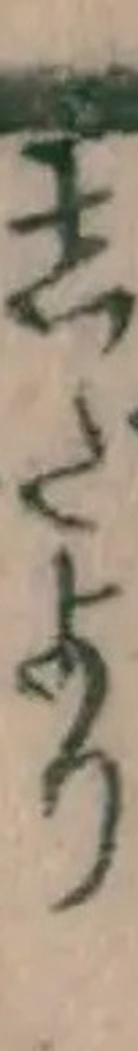したより
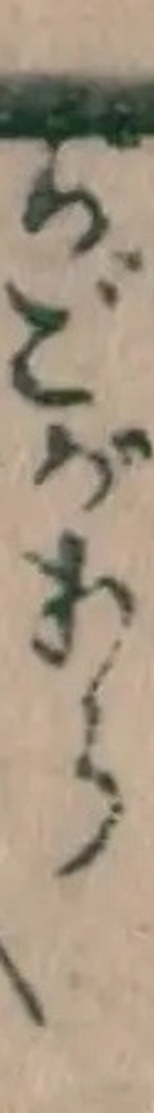かごがあら
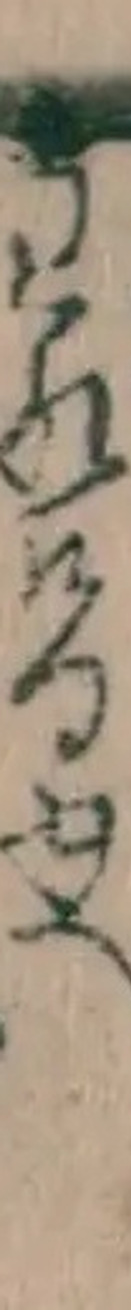われけるゆへ
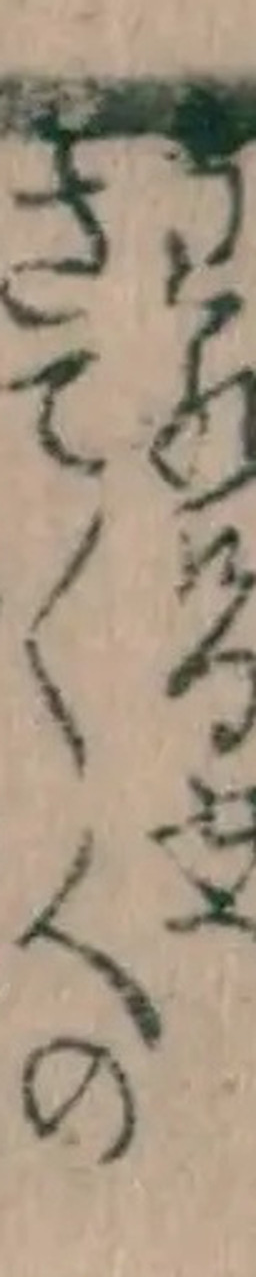さて〳〵人の
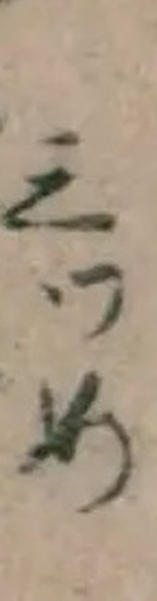三つめ
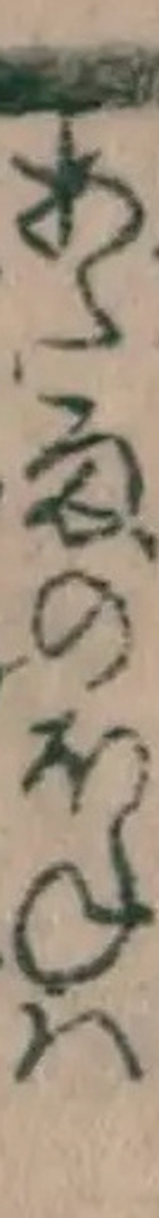あたまのほねは
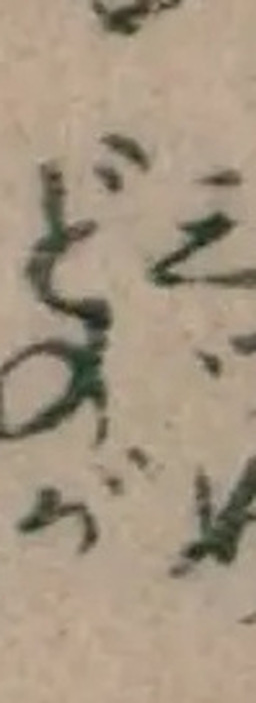どのが
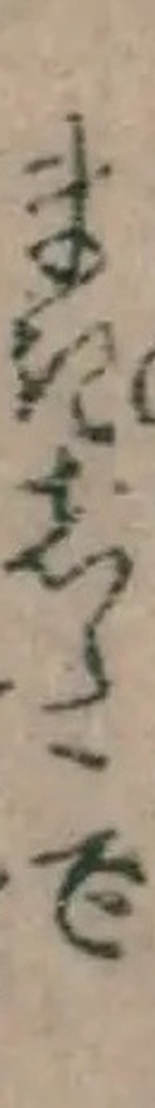まきしたで
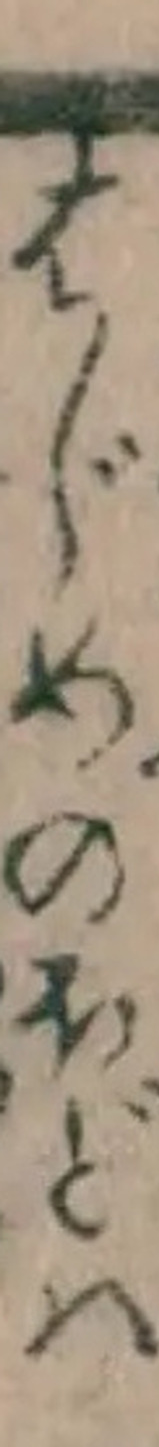はじめのほどは
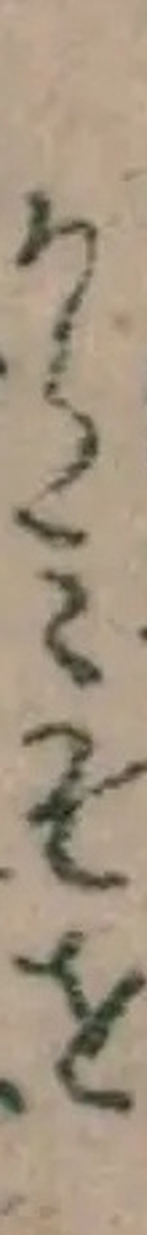からみそお
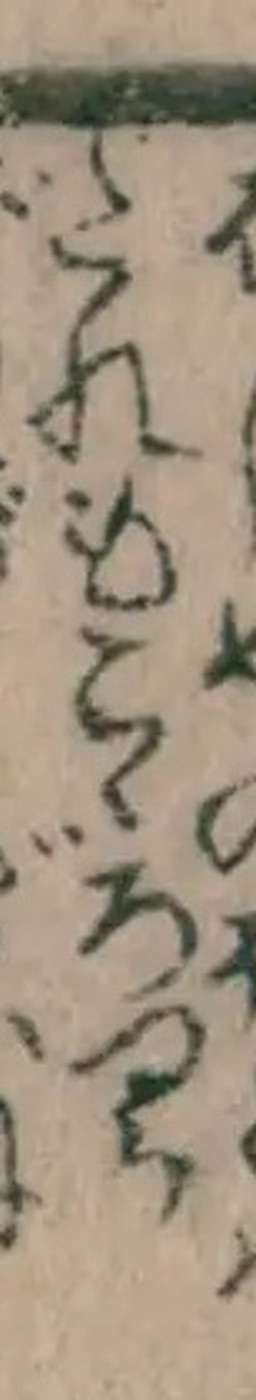たれもこゝろつか
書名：信有奇怪会
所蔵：国立国会図書館 National Diet Library, JAPAN
